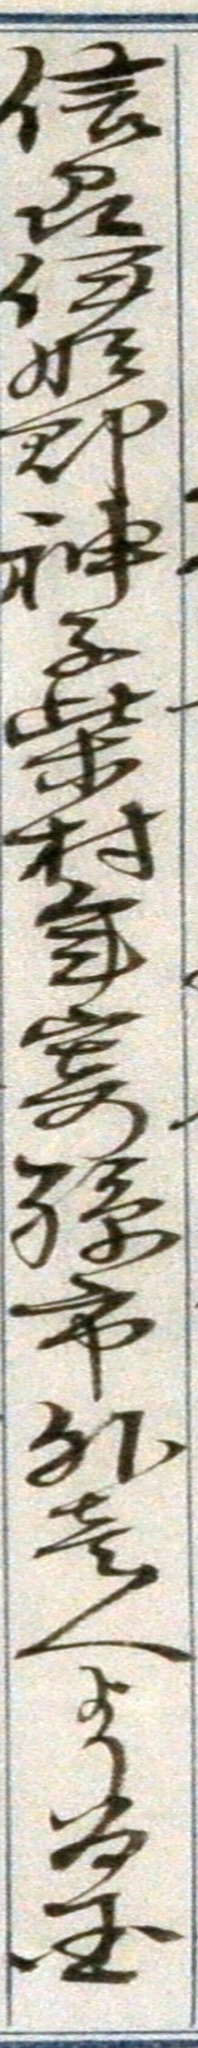信州伊奈郡神子柴村年寄孫市外壱人より為国
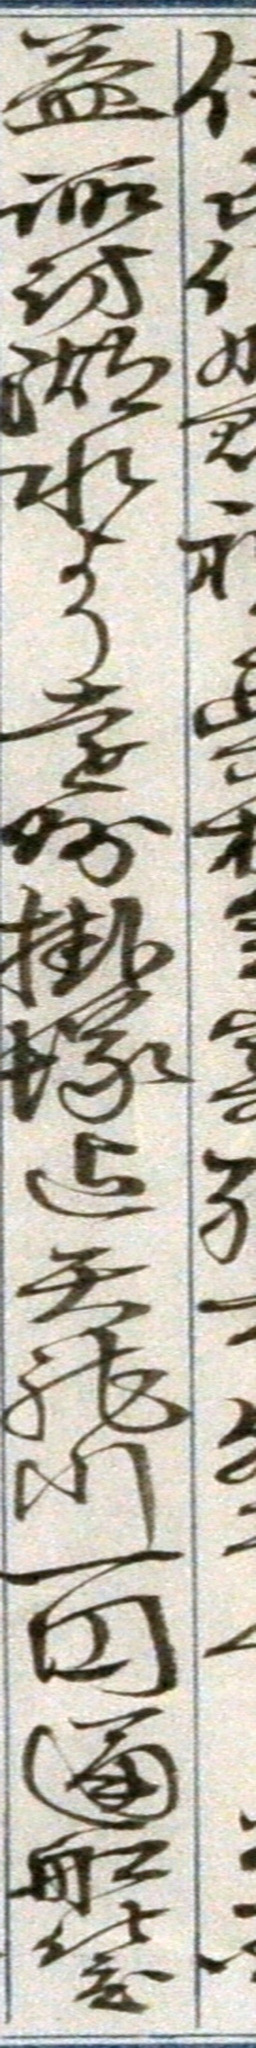益諏訪湖水より遠州掛塚迄天龍川一円通船仕度
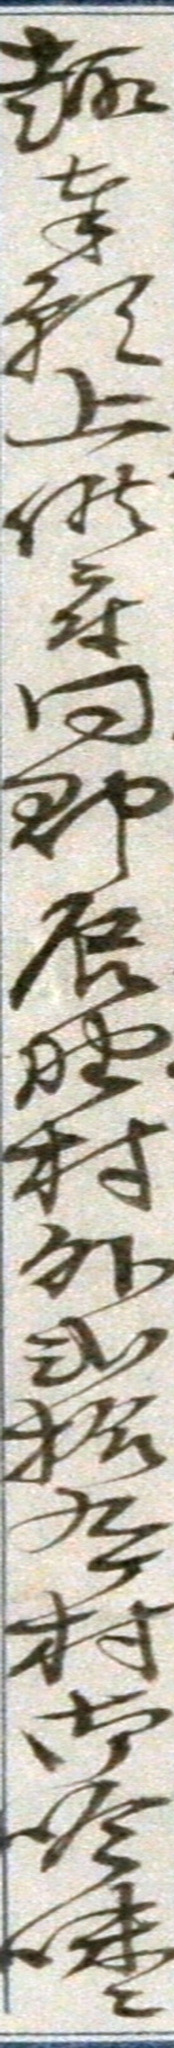趣奉願上候ニ付同郡辰野村外弐拾九ケ村御吟味ニ
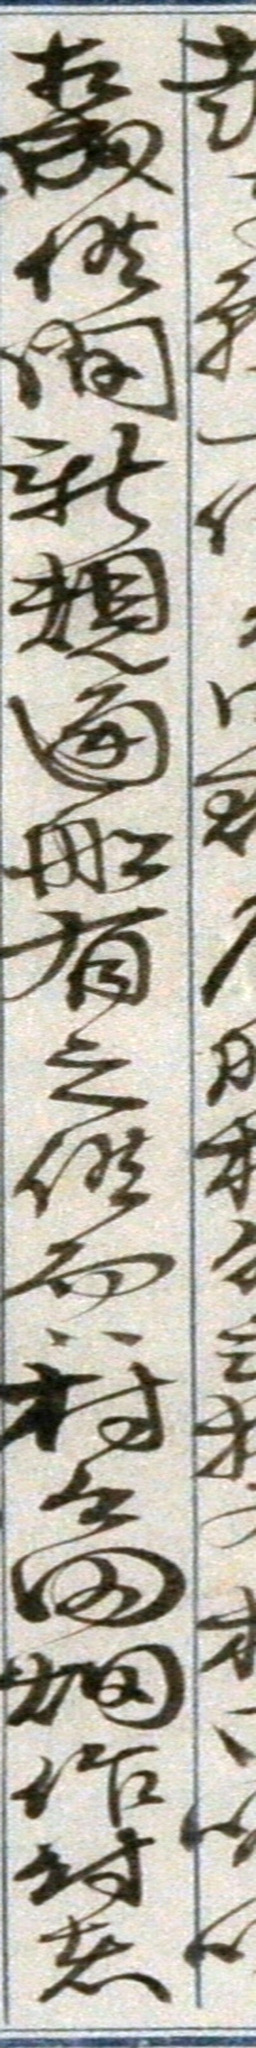相成候間新規通船有之候而ハ村々田畑作付者
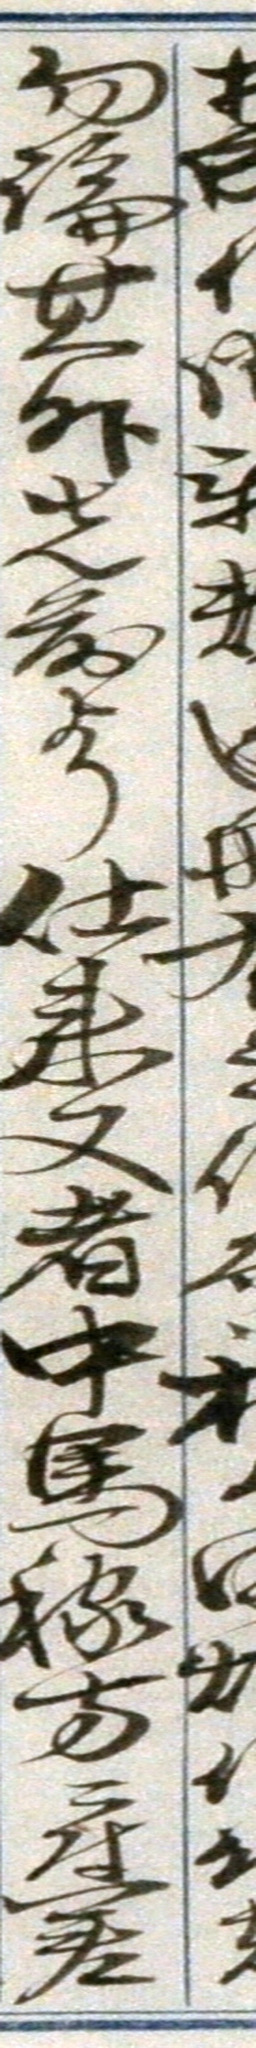勿論其外先荷より仕来又者中馬稼方ニ付差
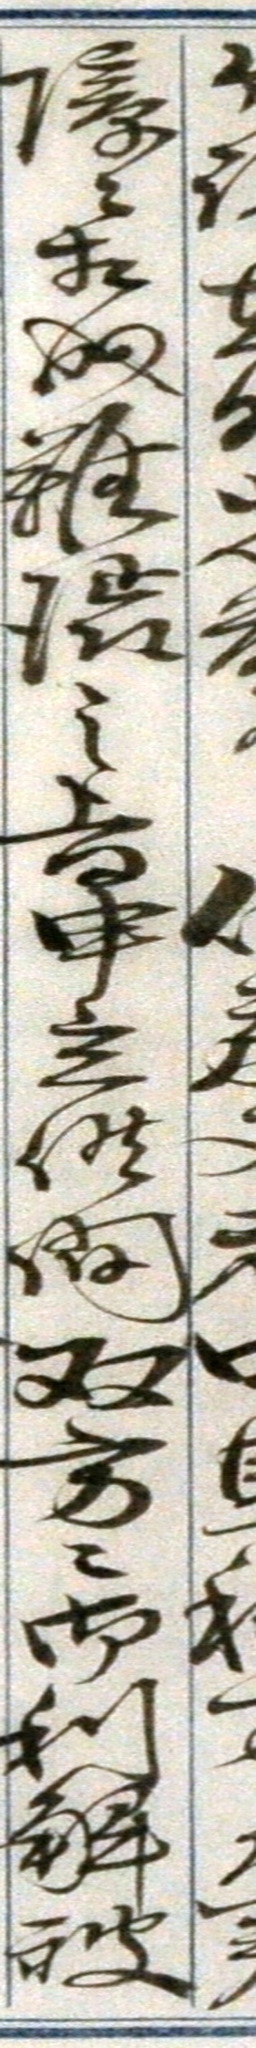障ニ相成難渋之旨申立候間双方ニ御利解被
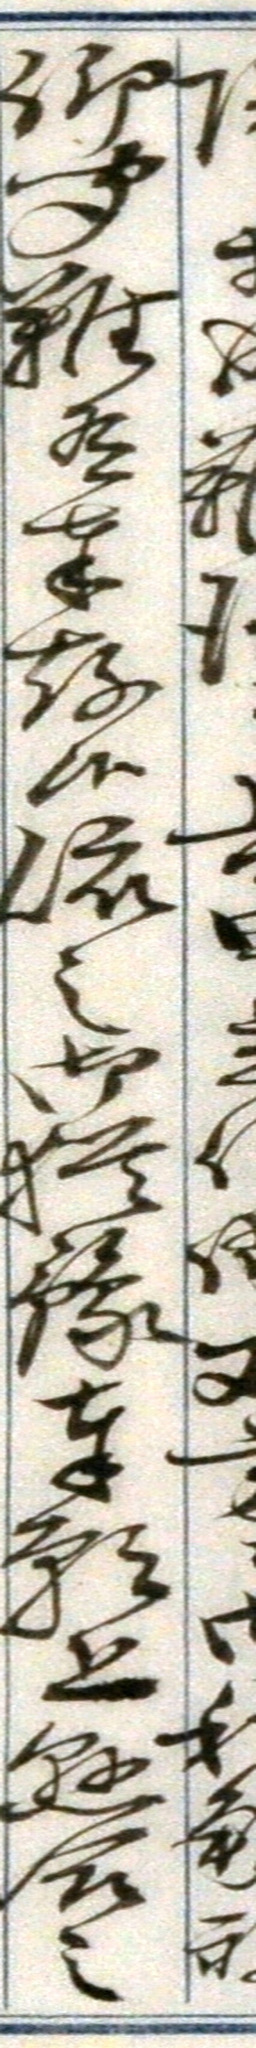仰聞難有奉存候依之御猶予奉願上懸合之
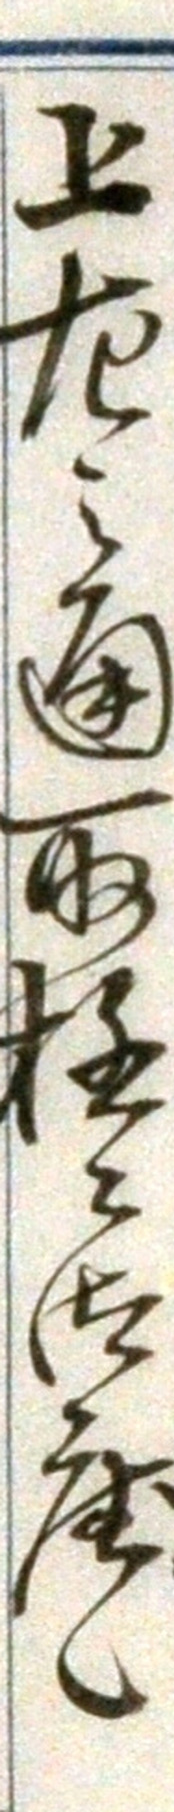上左之通取極ニ御座候
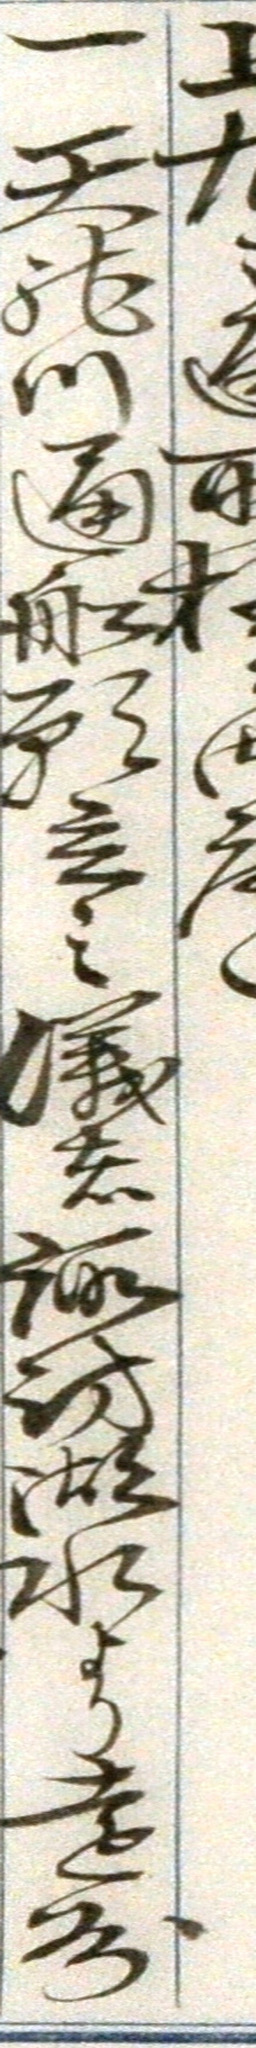一天龍川通船願立之儀者諏訪湖水より遠州
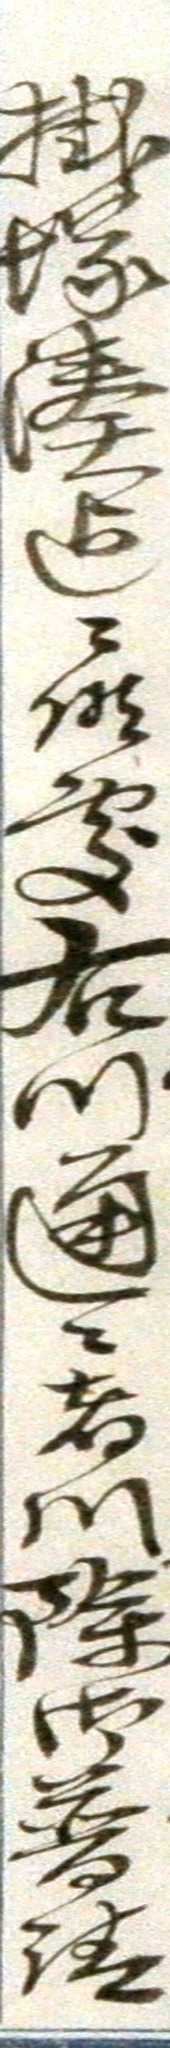掛塚湊迄ニ候處右川通ニ者川除御普請
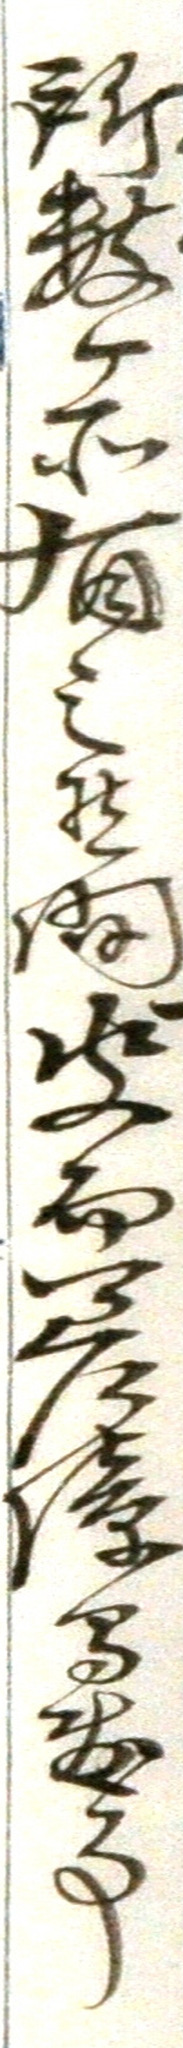所数ケ所有之候間決而差障間敷事

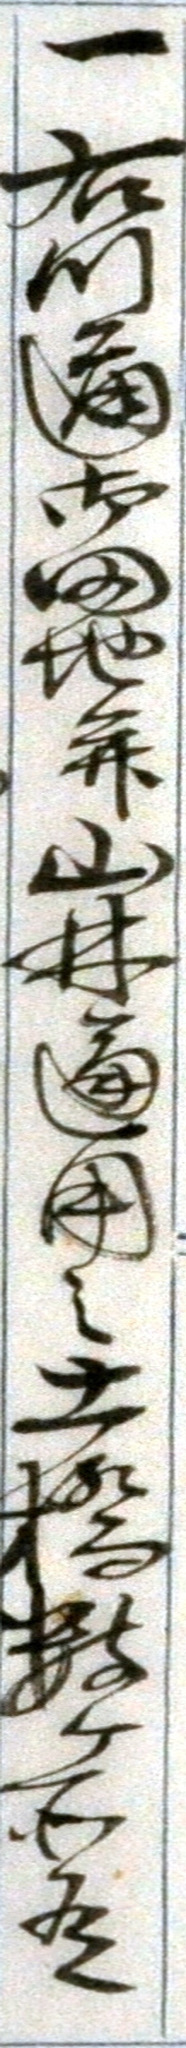一右川通御田地并山林通用之土橋数ヶ所有
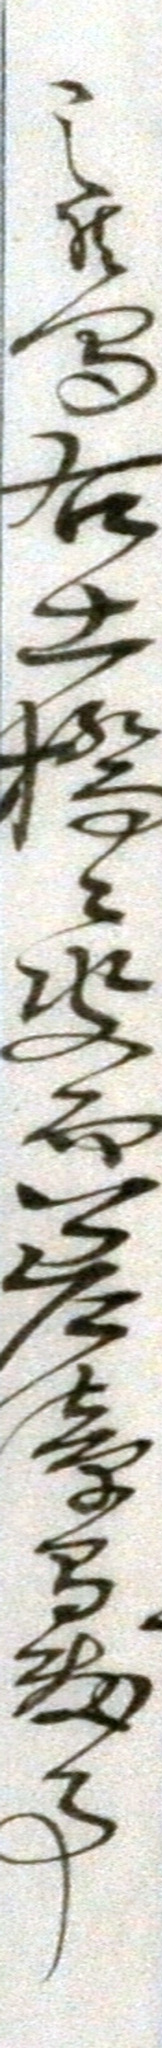之候間右土橋ニ決而差障間敷事
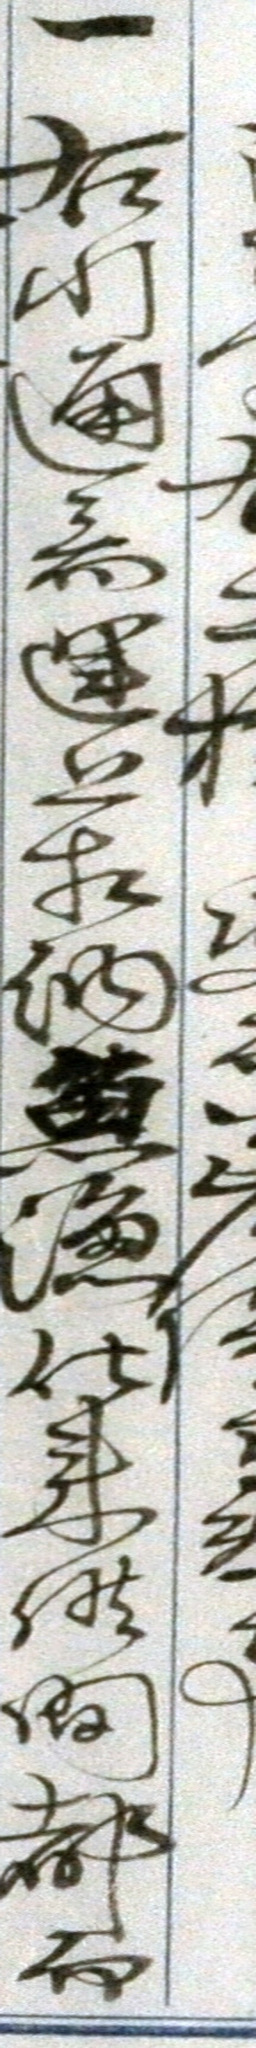一右川通ニ而運上相納魚漁仕来候間都而
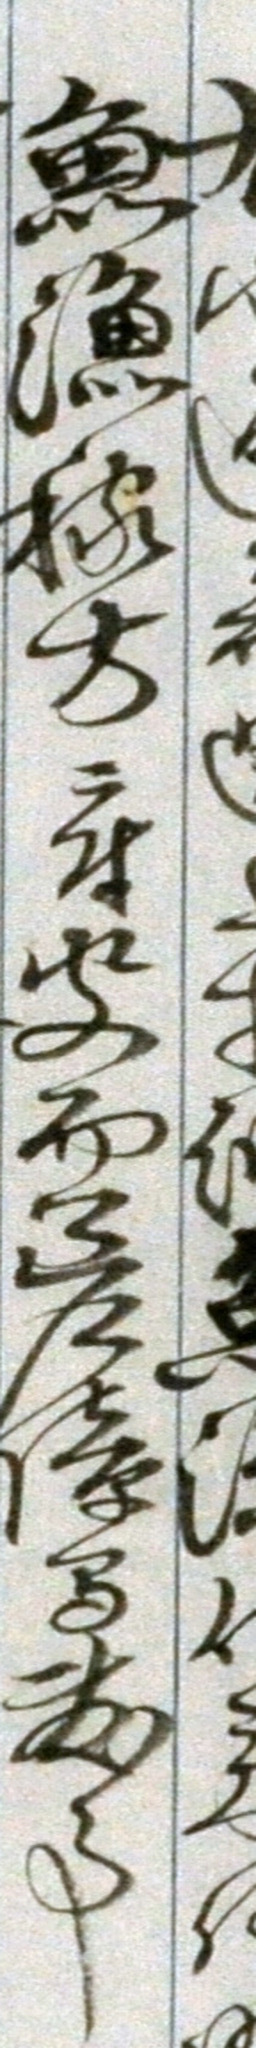魚漁稼方ニ付決而差障間敷事
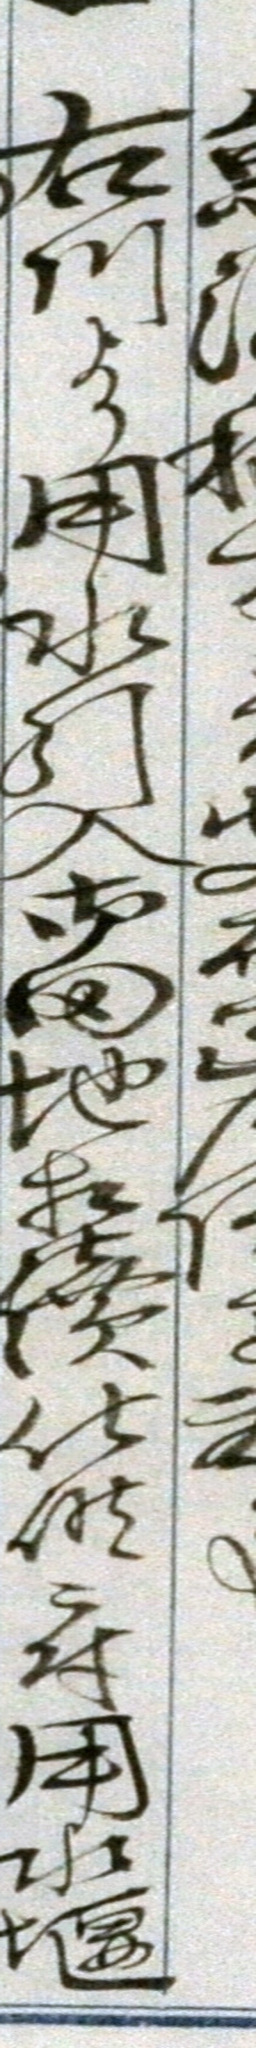一右川より用水引入御田地相続仕候ニ付用水堰
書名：天竜川通船難渋願并取極書
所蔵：伊那市立高遠町図書館・合同会社AMANE
